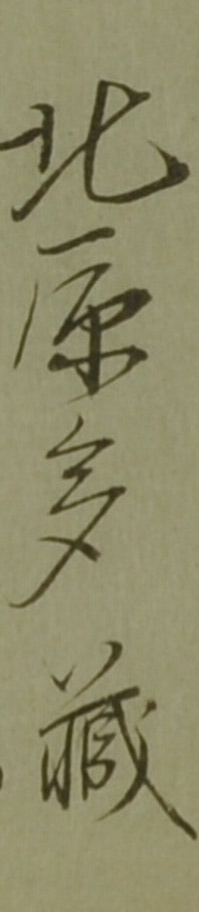北原多蔵
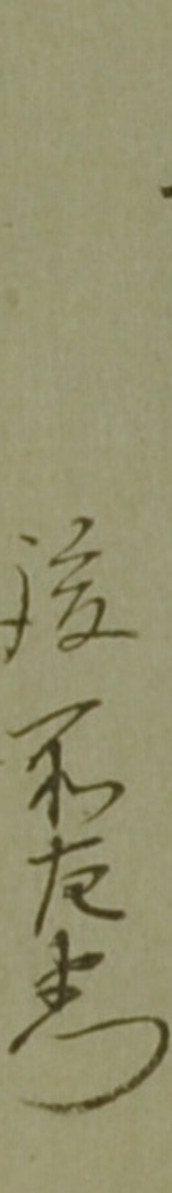後所左衛門
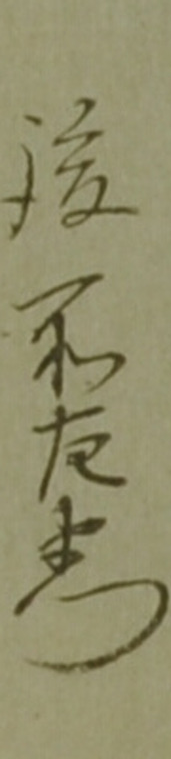後所左衛門
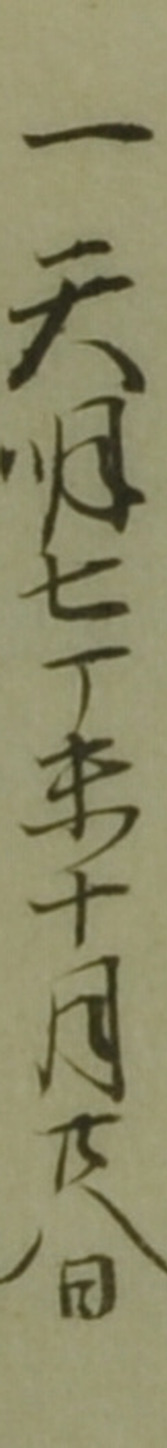一天明七丁未十月廿八日
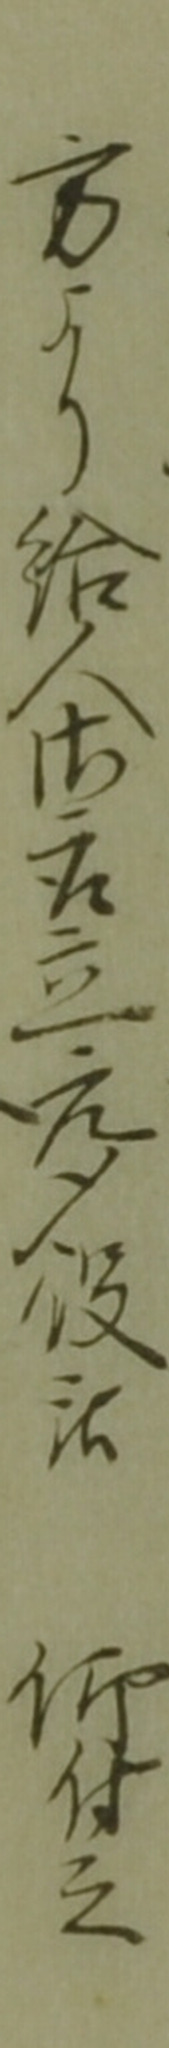方より給人御取立元〆役被仰付之
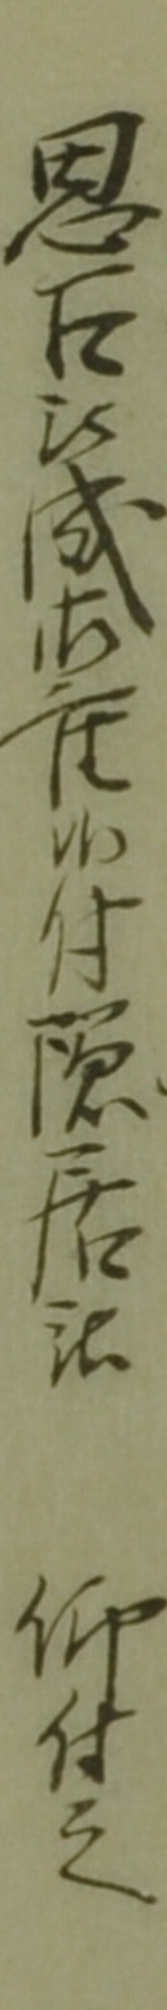思召被成御座候付隠居被仰付之
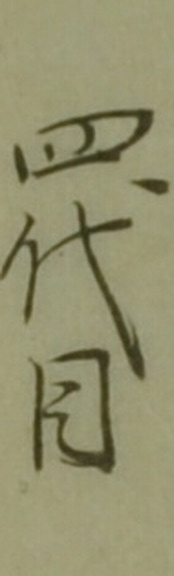四代目
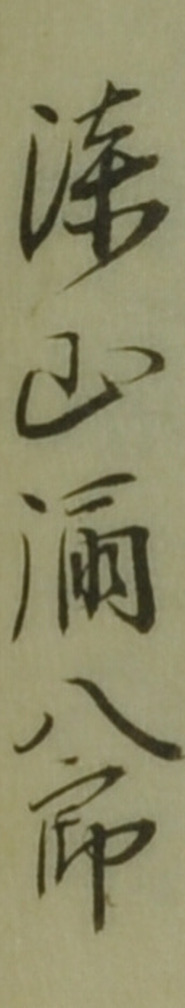漆山満八郎
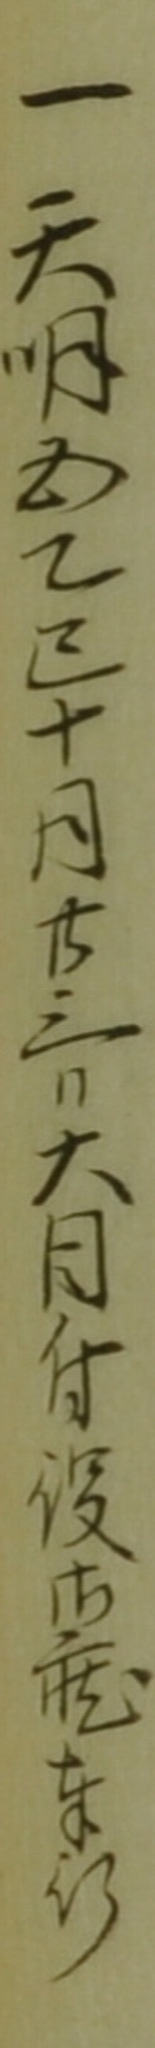一天明五乙巳十月廿三日大目付役御蔵奉行
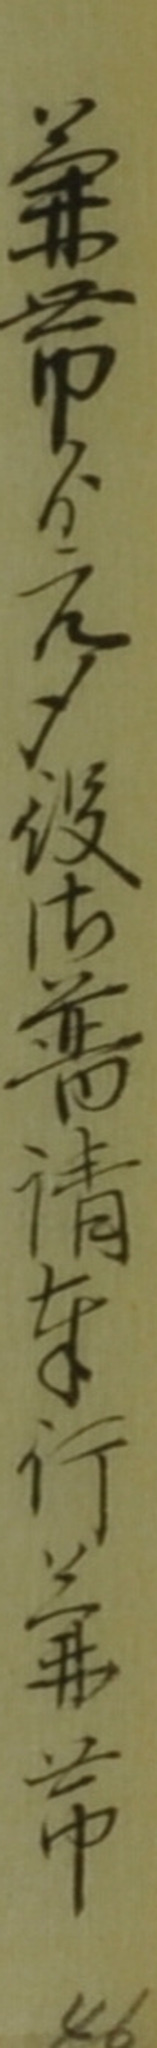兼帯ゟ元〆役御普請奉行兼帯
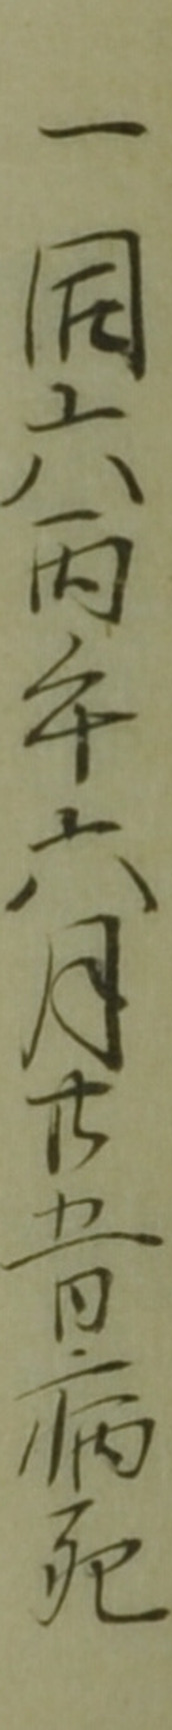一同六丙午六月廿五日病死
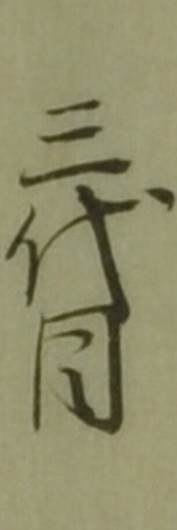三代目
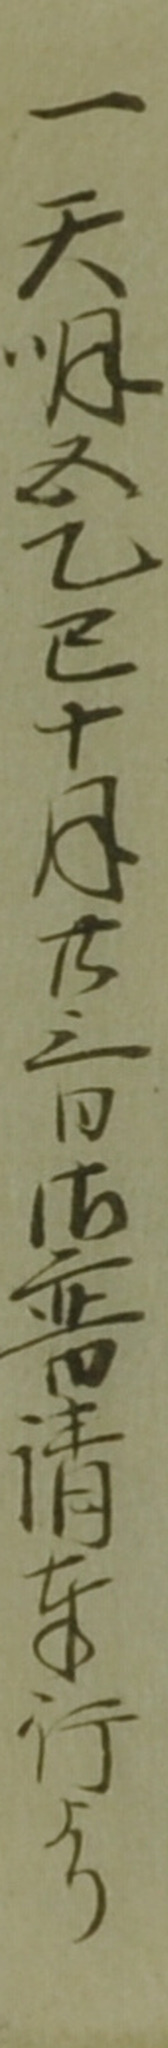一天明五乙巳十月廿三日御普請奉行より
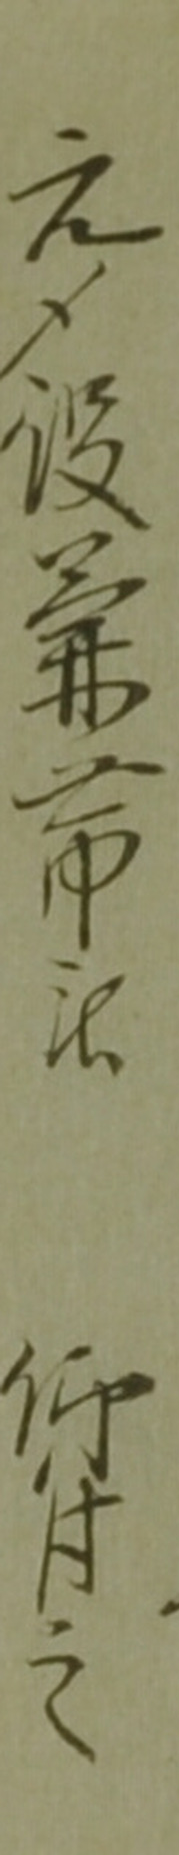元〆役兼帯被仰付之
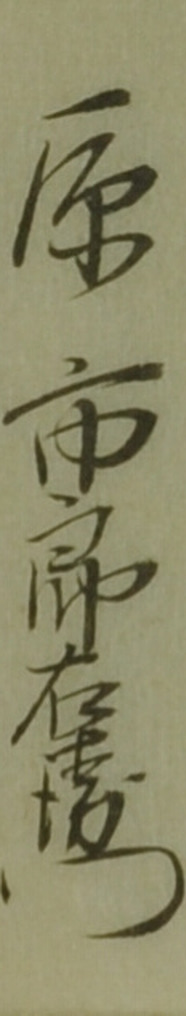原市郎右衛門
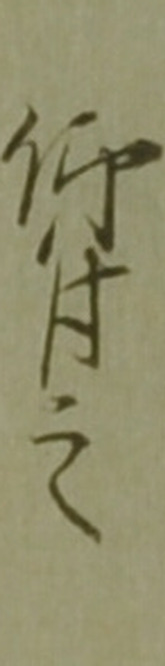仰付之
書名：諸御役代々録（七）
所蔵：伊那市立高遠町図書館・合同会社AMANE
